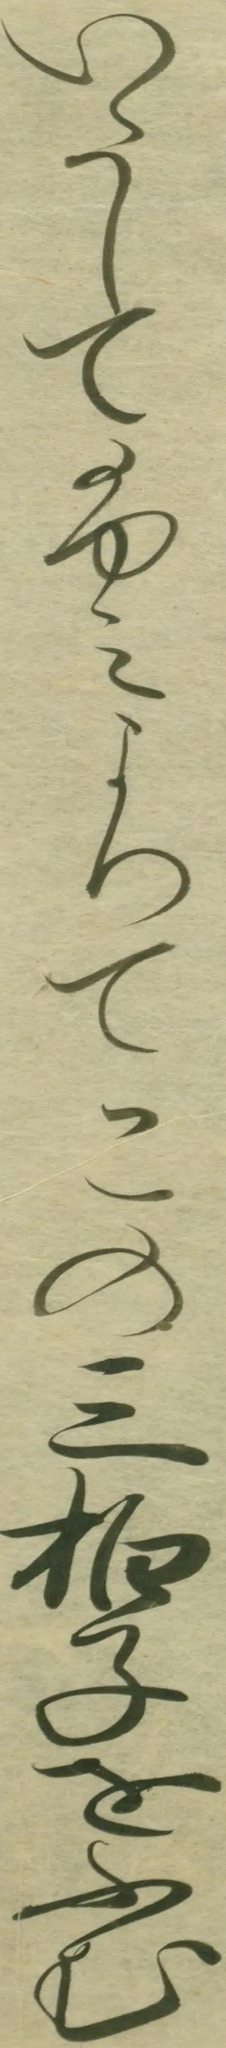いたしてふみよりてこの三拍子をふむ
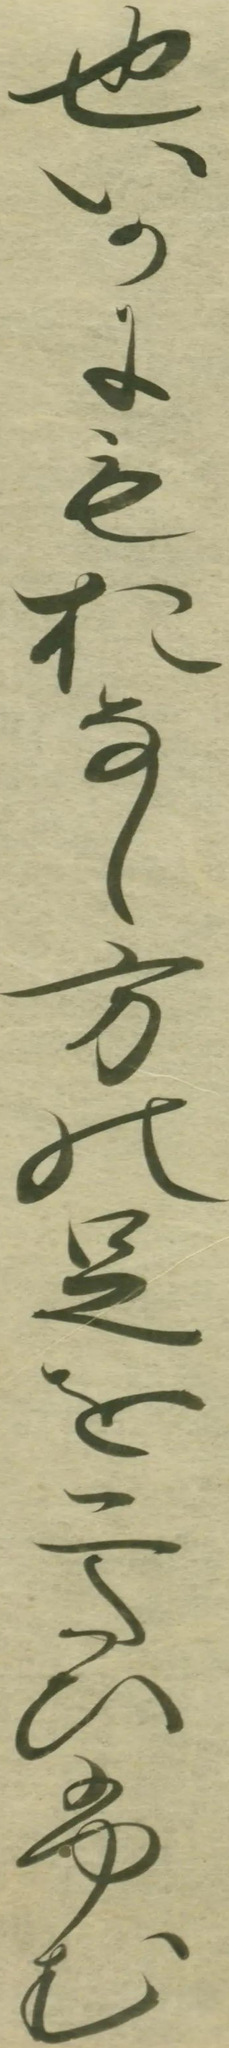也いかにもおなし方の足を二たひふむ
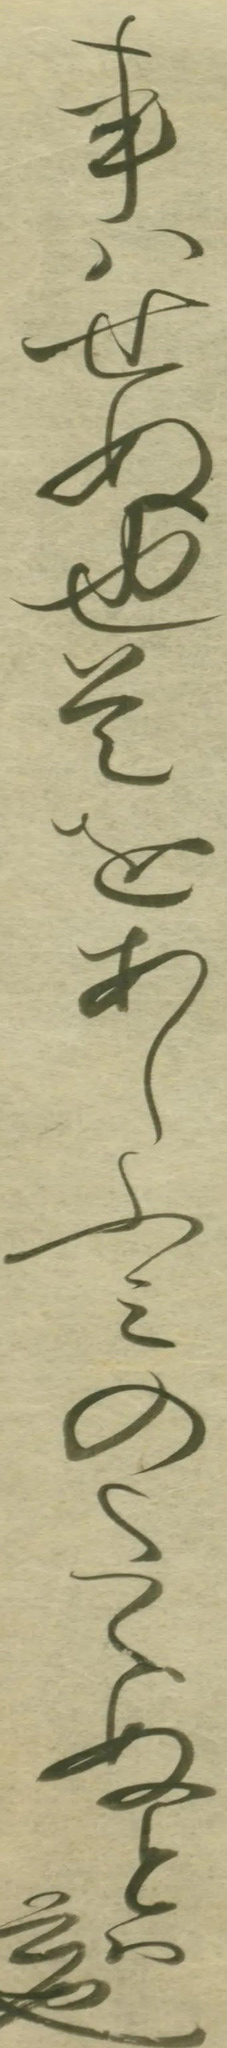事はせぬ也是をあしふみのたゝぬとは云也
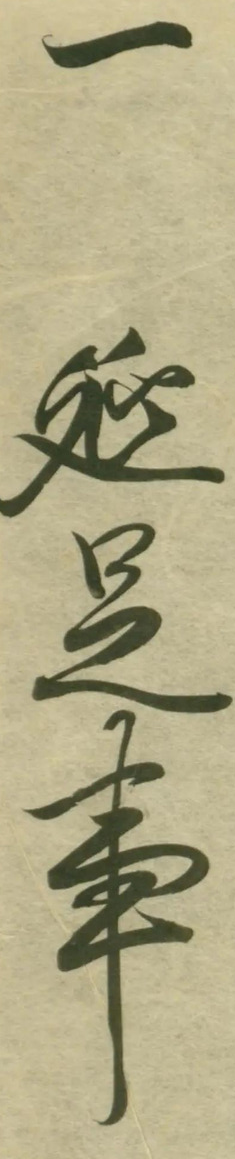一延足事
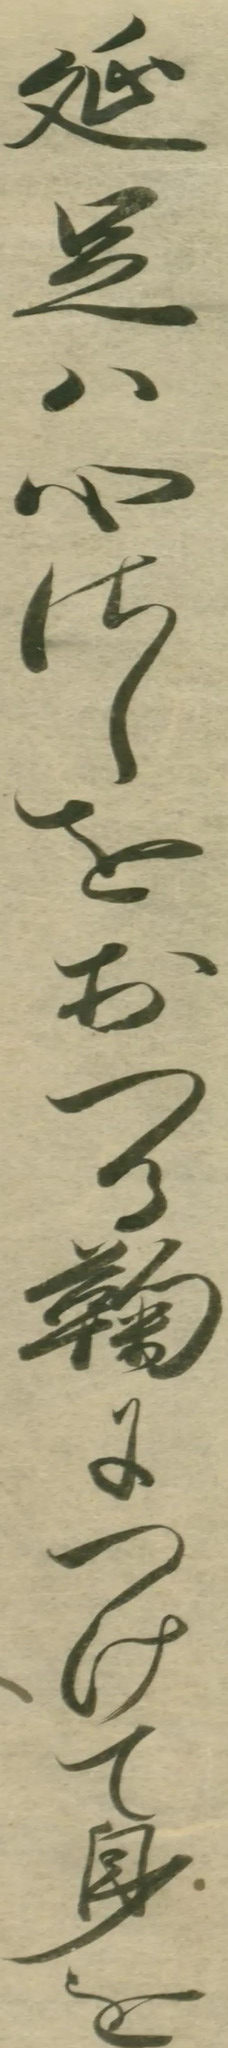延足は心さしをおつる鞠につけて身を

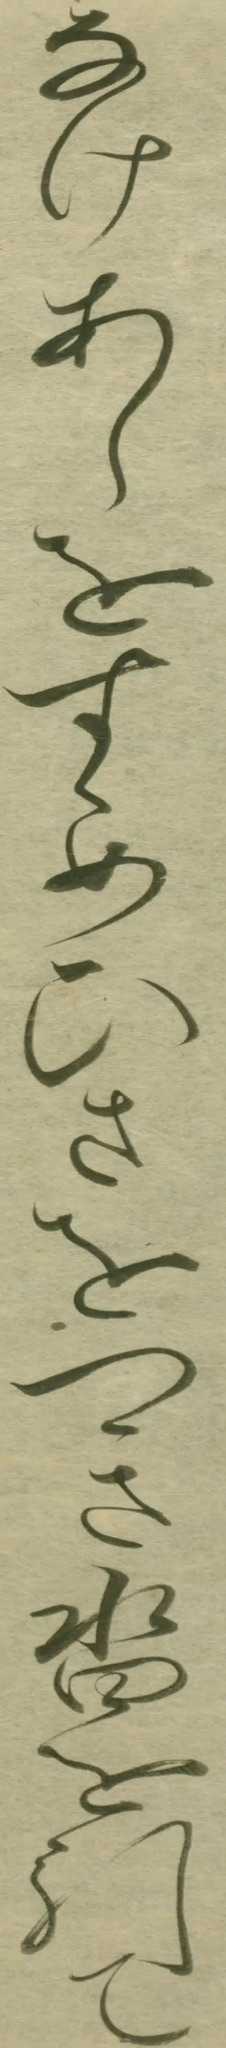なけあしをすゝめひさをつき沓を引て
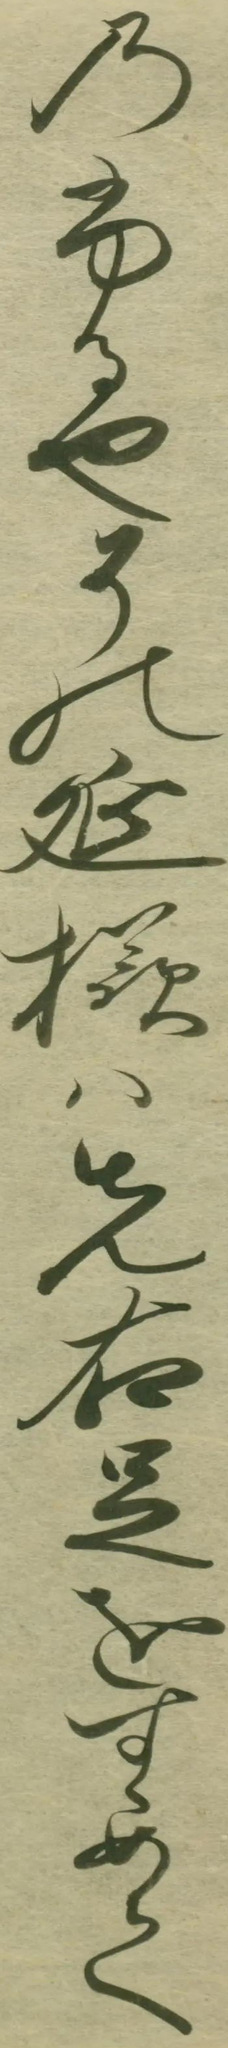のふる也その延様は先右足をすゝめて
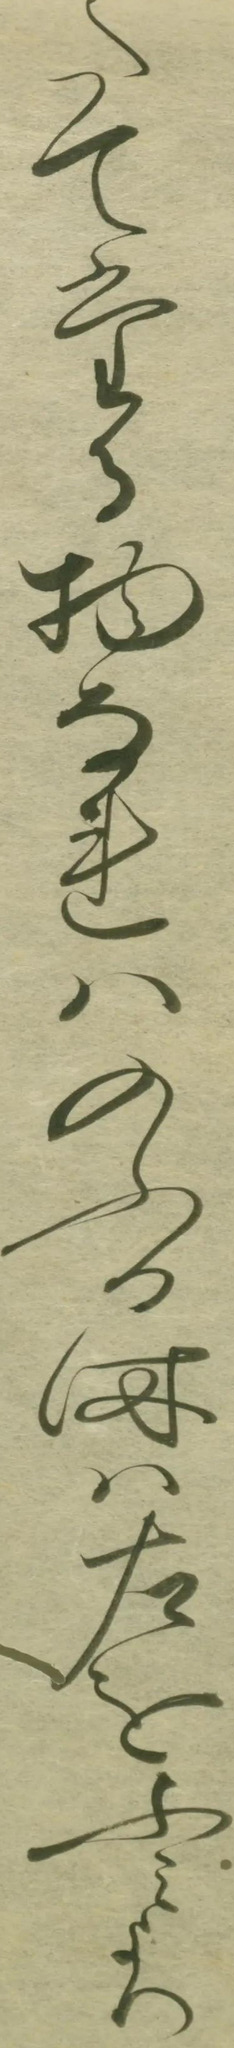たてたる物なれはのふる時は左をふみより
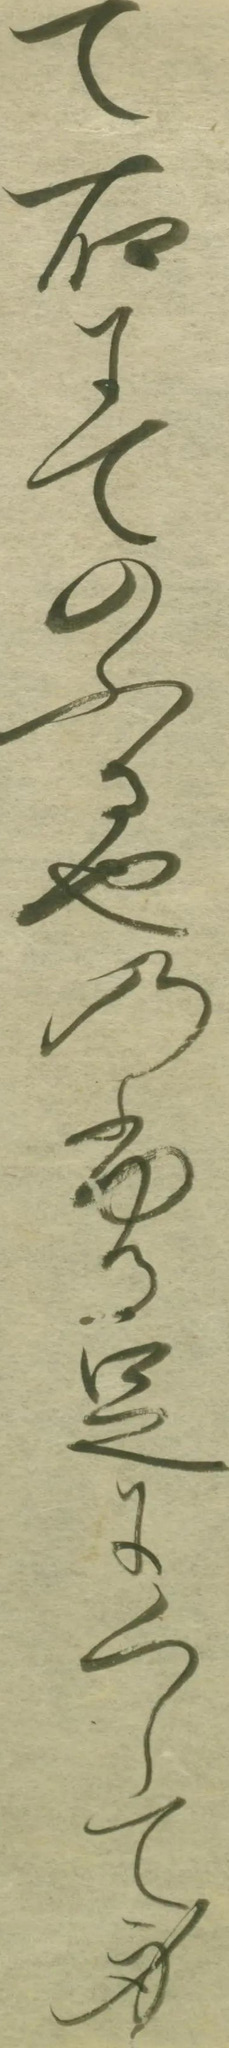て右にてのふる也のふる足にくして身
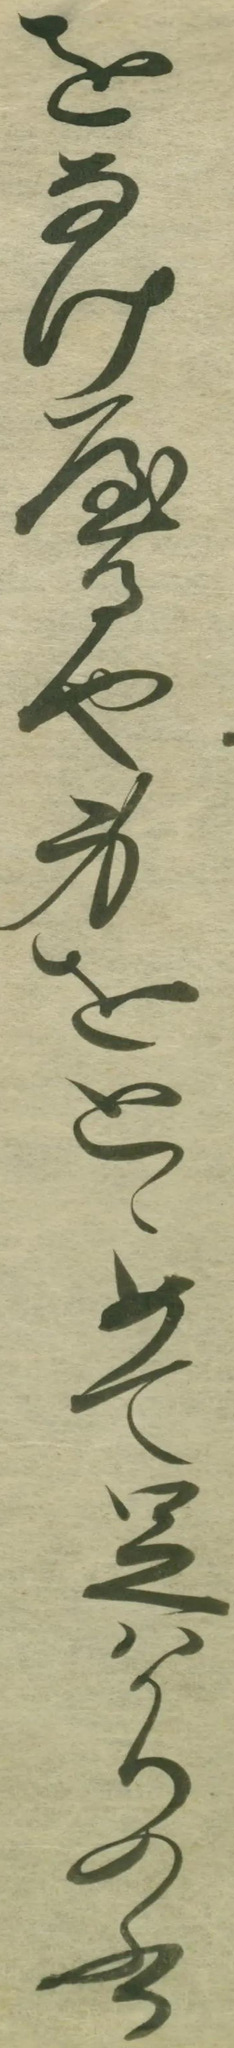をなけやる也身をとゝめて足はかりのふる
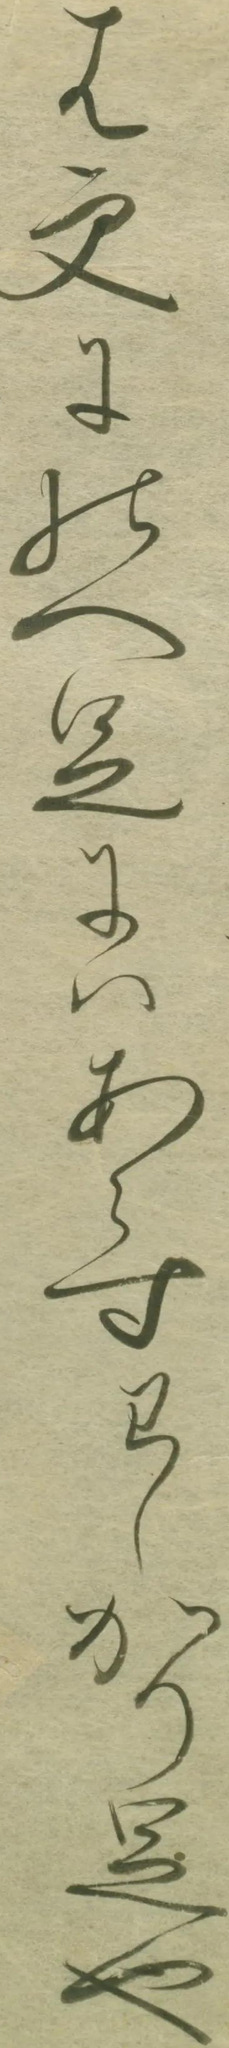は更にのへ足にはあらすわしかり足也
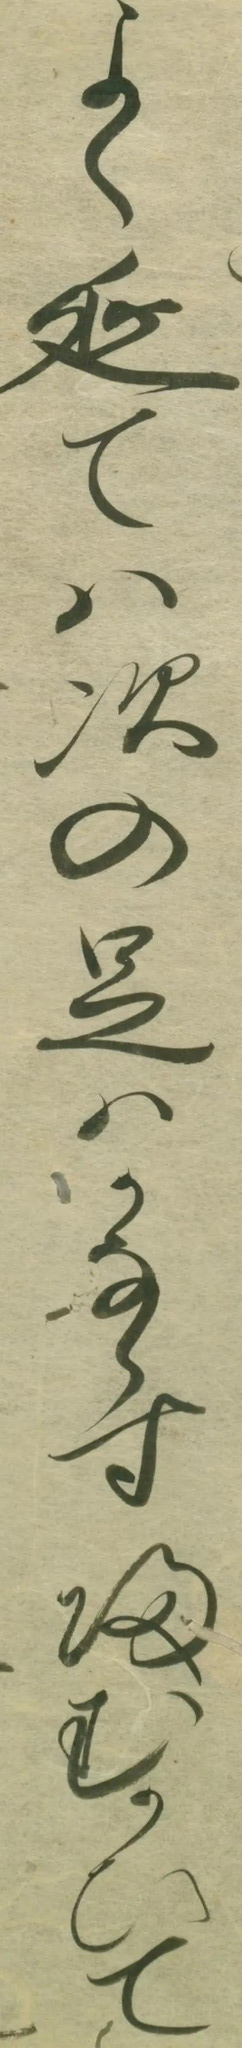よく延ては次の足はかならす帰むかひて
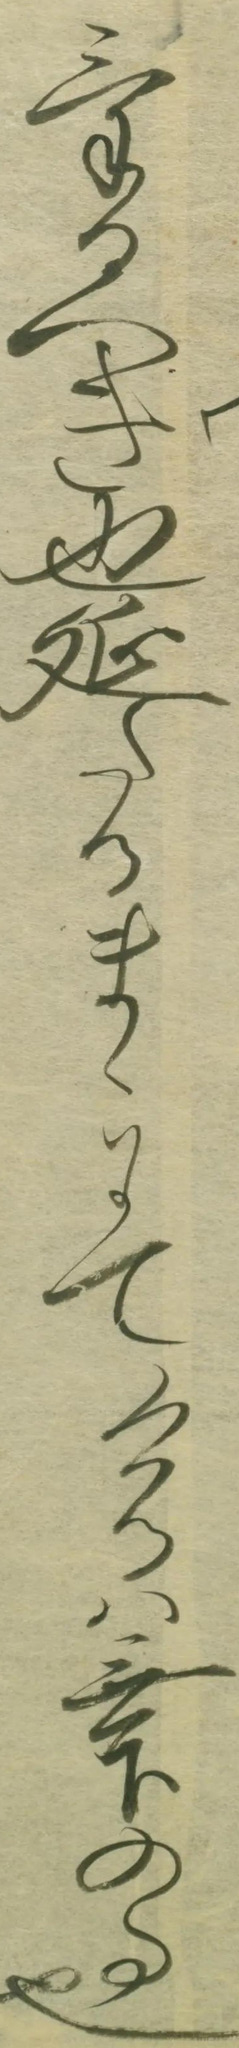けるへき也延たるまゝにてけるは無下の事也
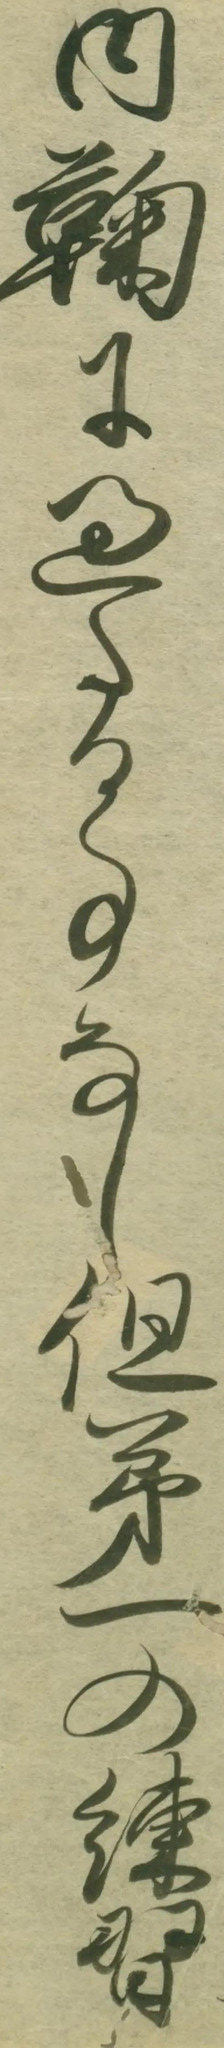内鞠に過たる事なし但第一の練習
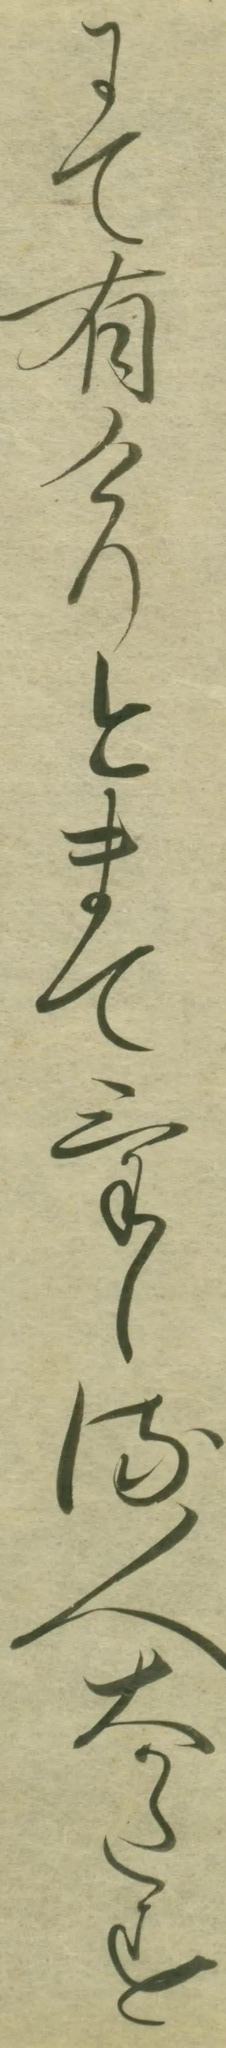にて有けりとまてけしる人大かたす
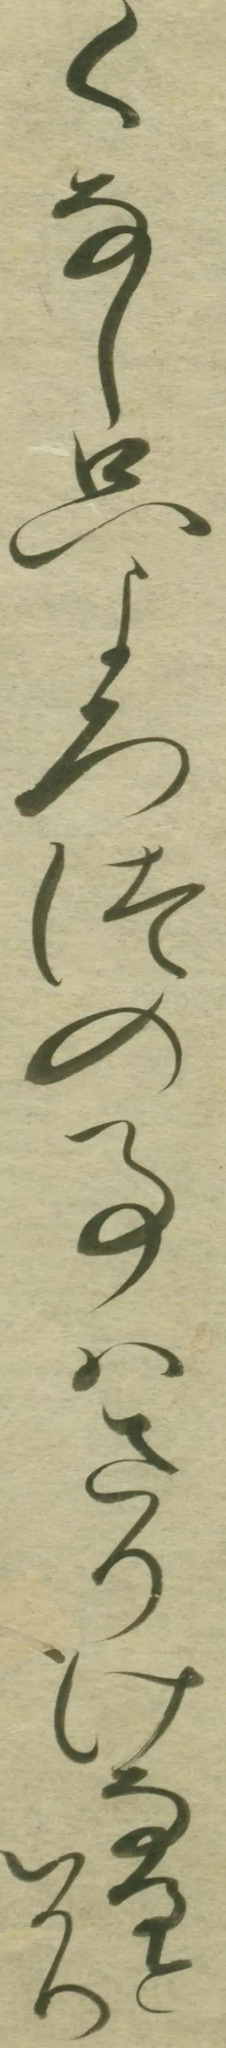くなし只よろつの事はさりけなるとはかり
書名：蹴鞠之条々大概
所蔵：国立国会図書館 National Diet Library, JAPAN
